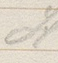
ist.
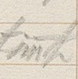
Wenn
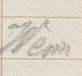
oder
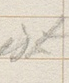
sein
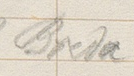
Ingenieur
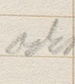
noch
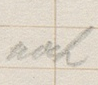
rechter
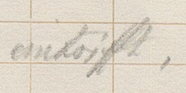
eintrifft,
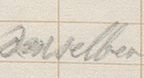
denselben
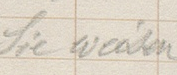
Sie weisen und
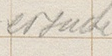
ersuche
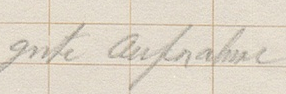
gute Aufnahme,
